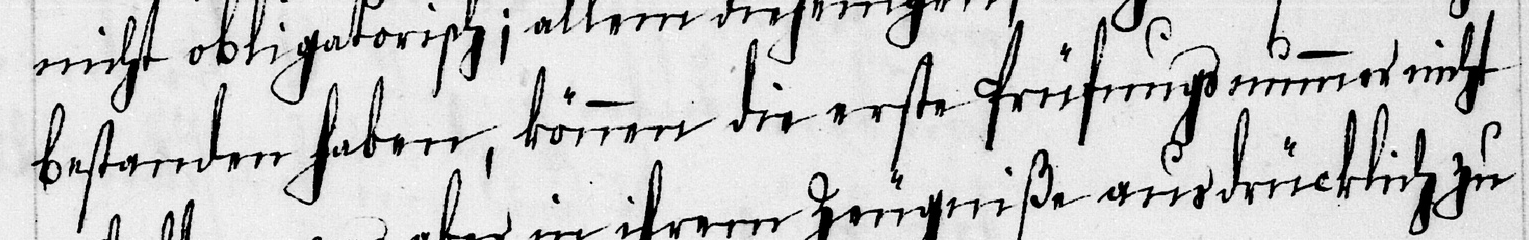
bestanden haben, können die erste Prüfungsnummer nicht
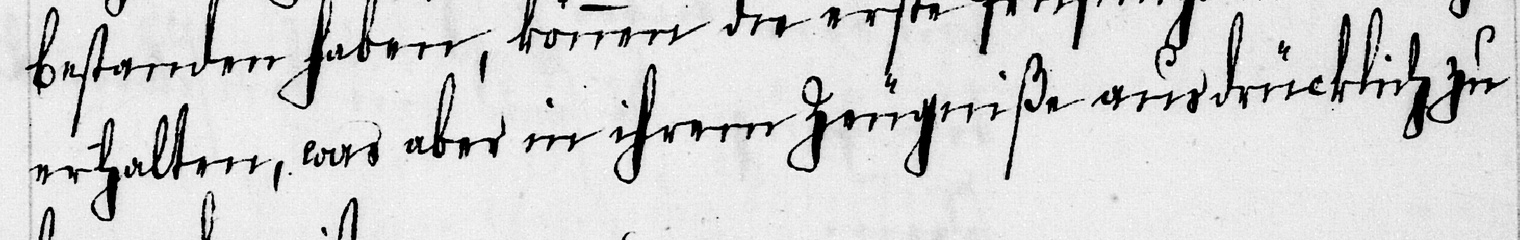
erhalten, was aber in ihrem Zeugniße ausdrücklich zu
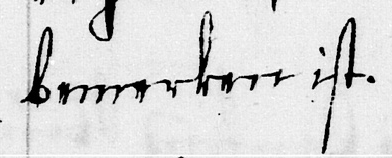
bemerken ist.
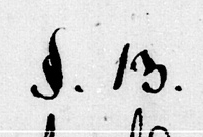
§. 13.
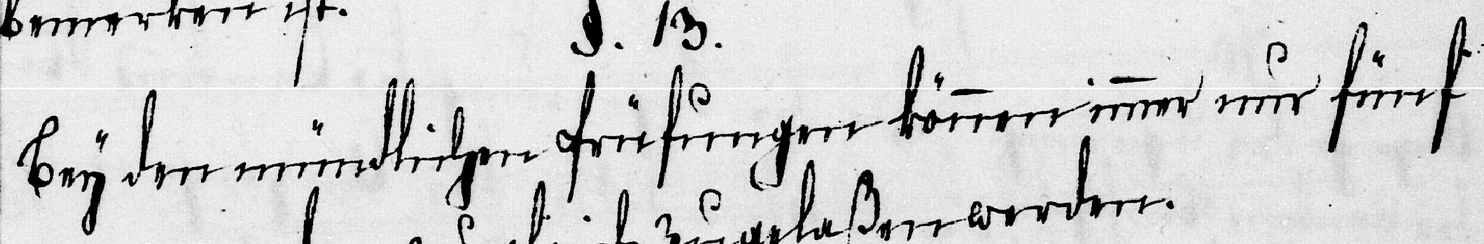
Bey den mündlichen Prüfungen können immer nur fünf
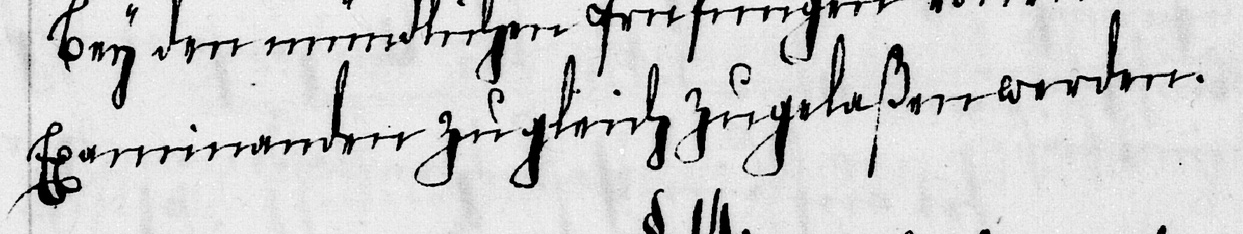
Examinanden zugleich zugelaßen werden.
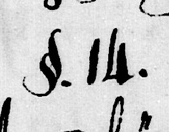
§. 14.
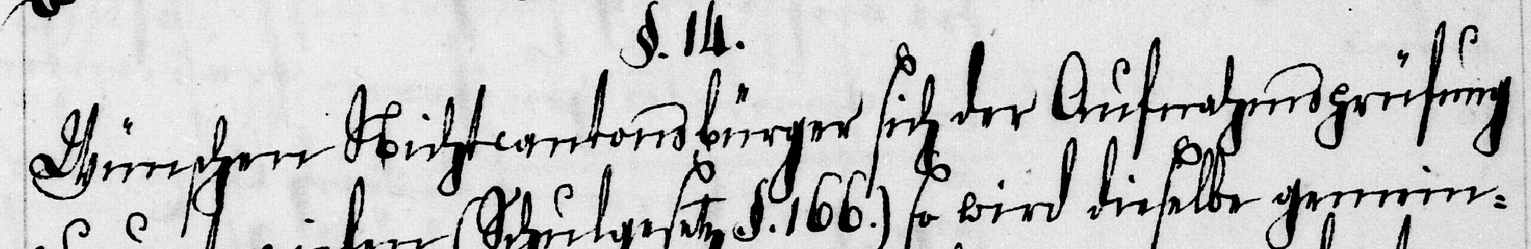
Wünschen Nichtcantonsbürger sich der Aufnahmsprüfung
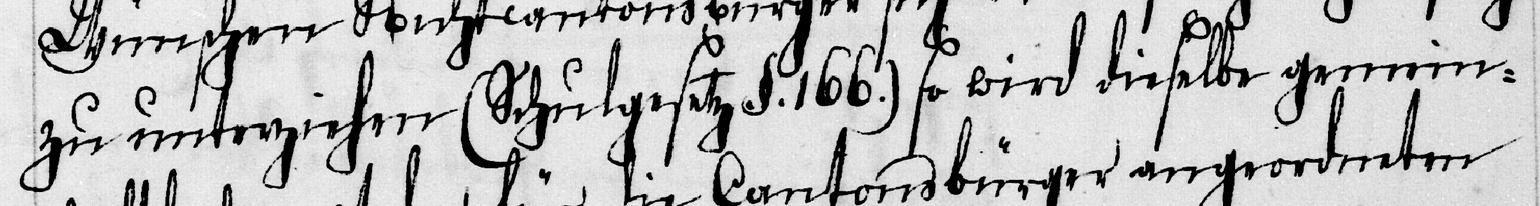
zu unterziehen (Schulgesetz §. 166.) so wird dieselbe gemein¬
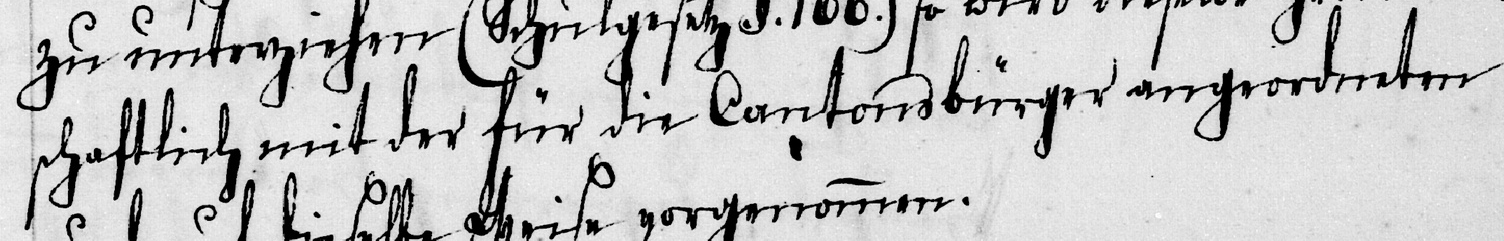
schaftlich mit der für die Cantonsbürger angeordneten
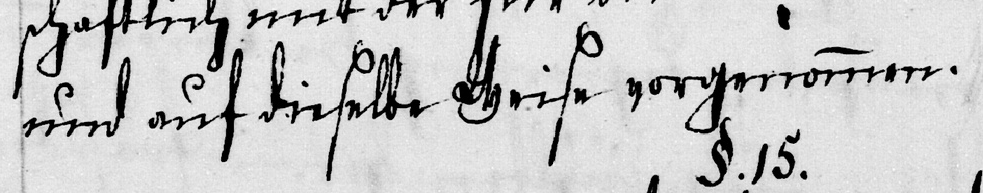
und auf dieselbe Weise vorgenommen.
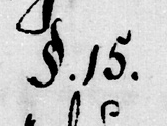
§. 15.
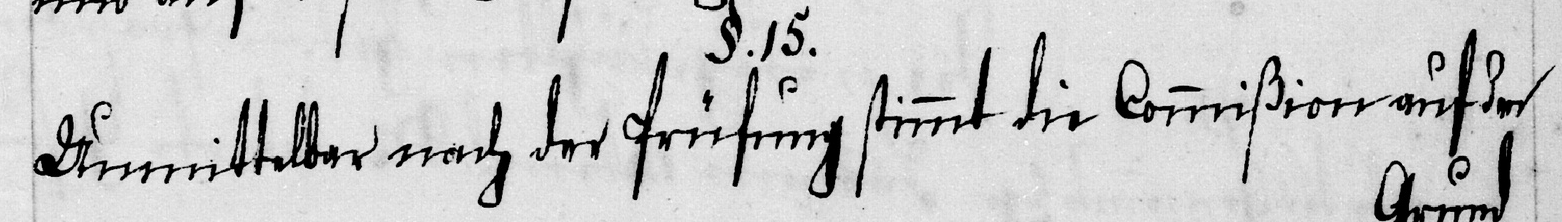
Unmittelbar nach der Prüfung stimmt die Commißion auf dem
